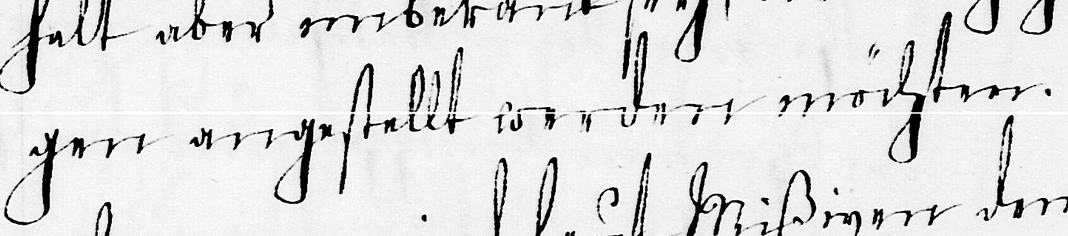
gen angestellt werden möchten.
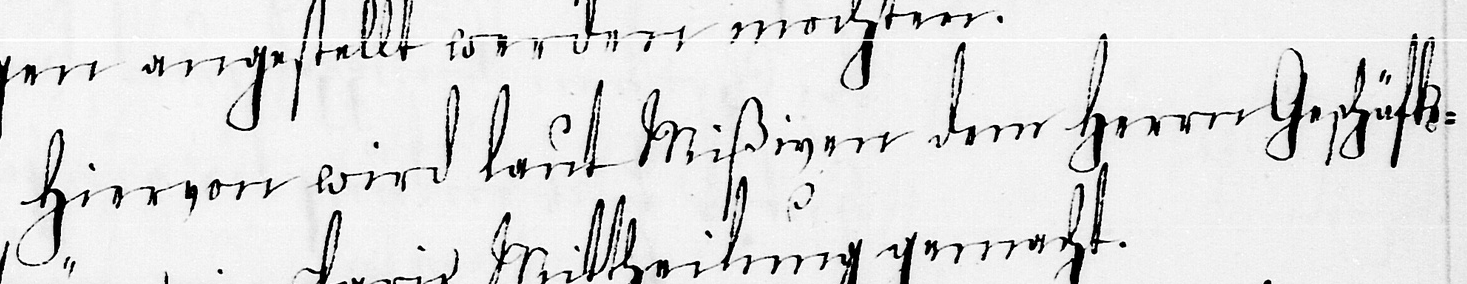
Hiervon wird laut Mißiven dem Herrn Geschäft¬
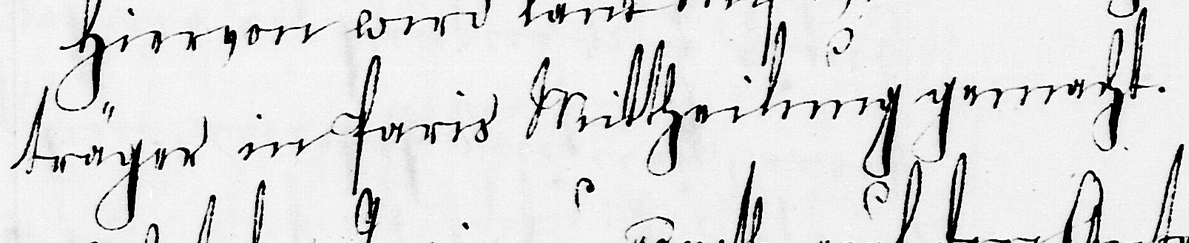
sträger in Paris Mittheilung gemacht.
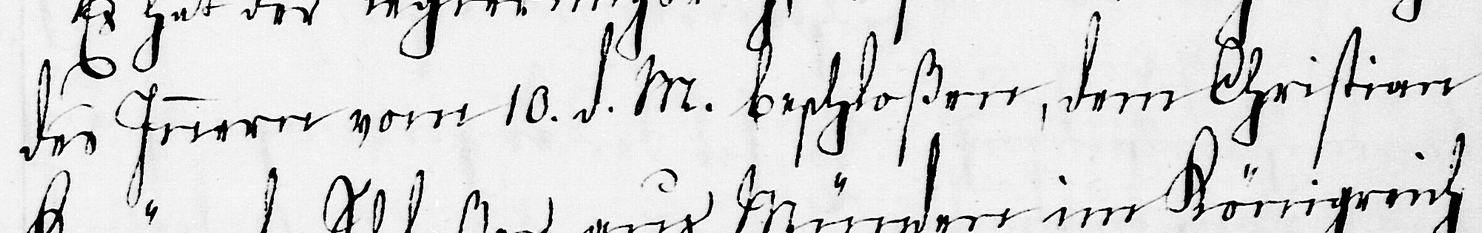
des Innern vom 10. d. M. beschloßen, dem Christian
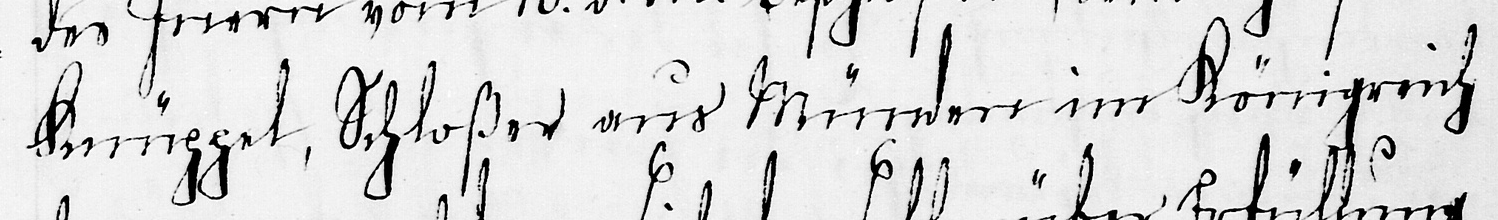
Knüppel, Schloßer aus Münden im Königreich
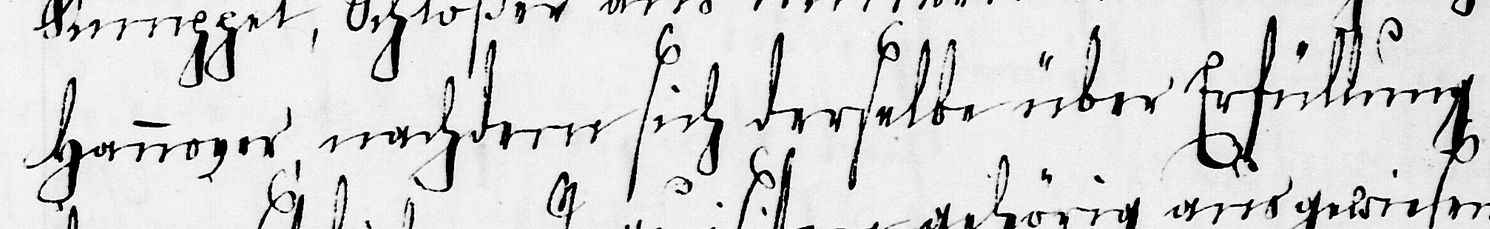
Hannover, nachdem sich derselbe über Erfüllung
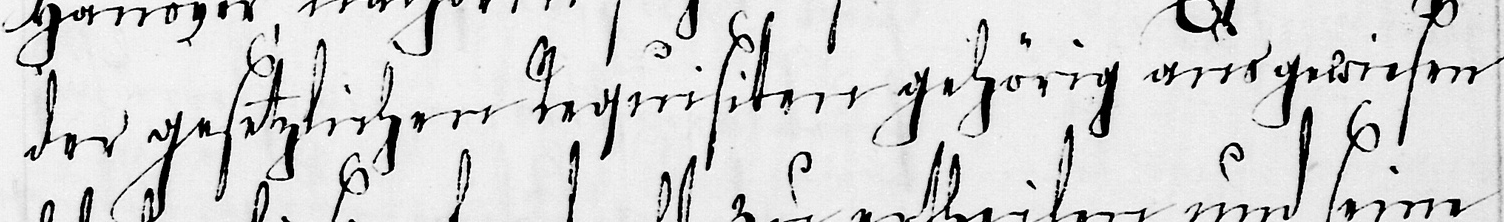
der gesetzlichen Requisiten gehörig ausgewiesen
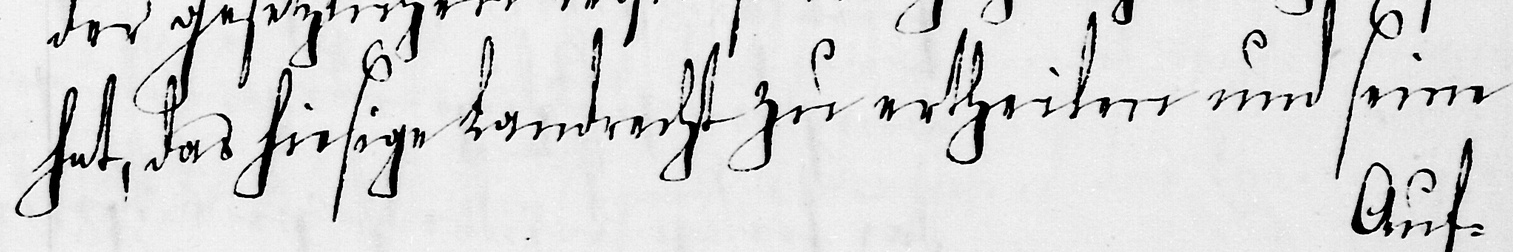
hat, das hiesige Landrecht zu ertheilen und seine
